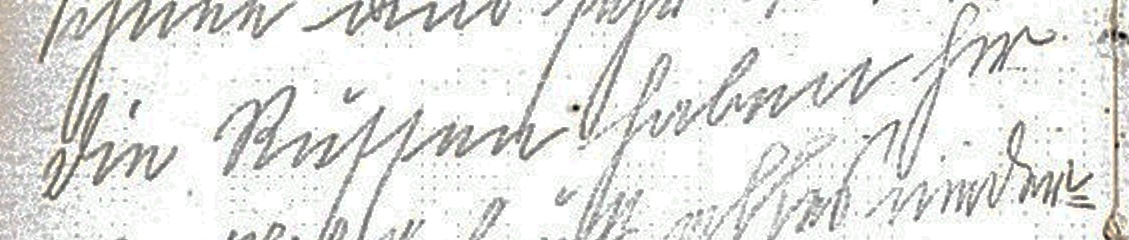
Die Russen haben hier
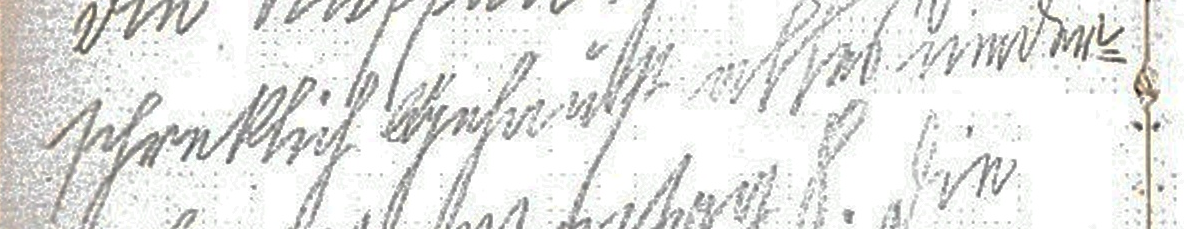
schrecklich gehaust alles nieder-
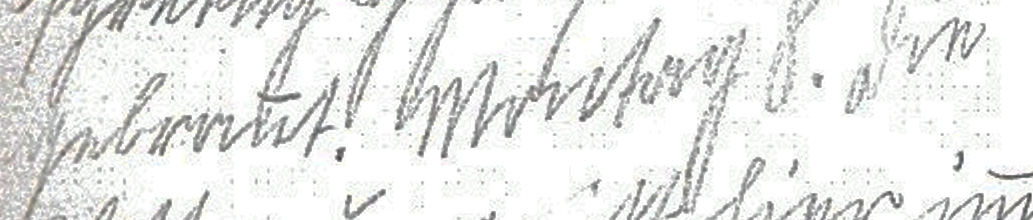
gebrannt. Montag 8. Die
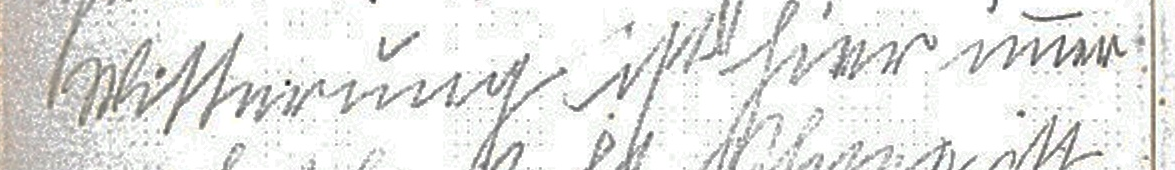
Witterung ist hier immer
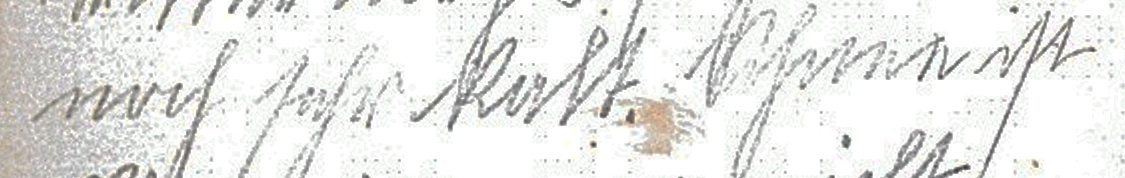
noch serhr kalt. Schnee ist
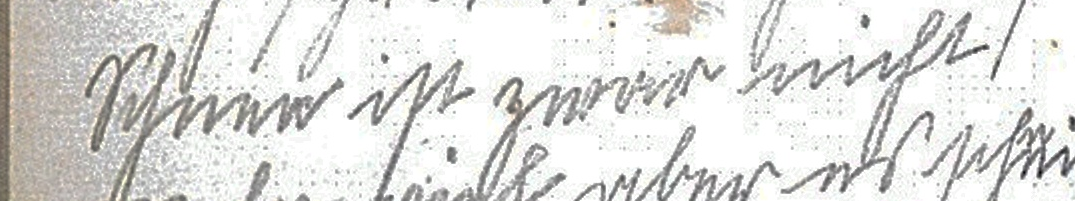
Schnee ist zwar nicht
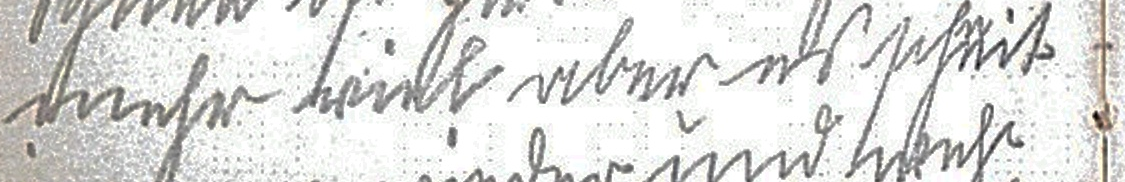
mehr viel aber es schneit
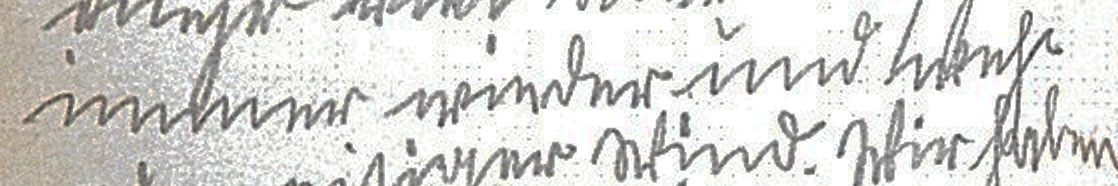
immer wieder und weht
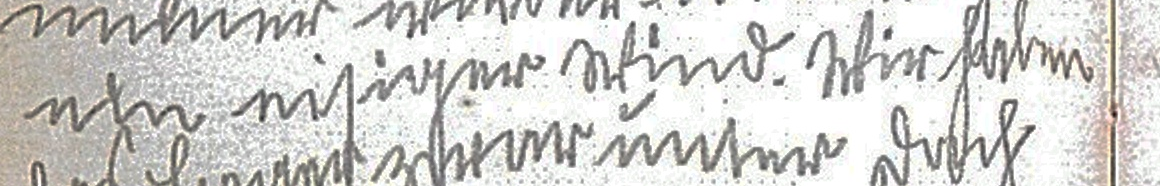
ein eisiger Wind. Wir haben
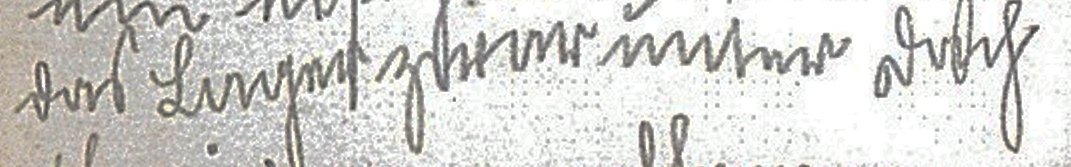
das Lager zwar unter Dach
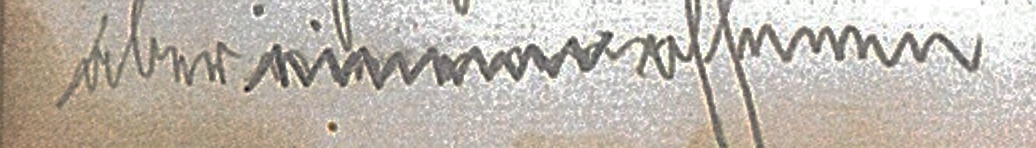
aber im offenen
